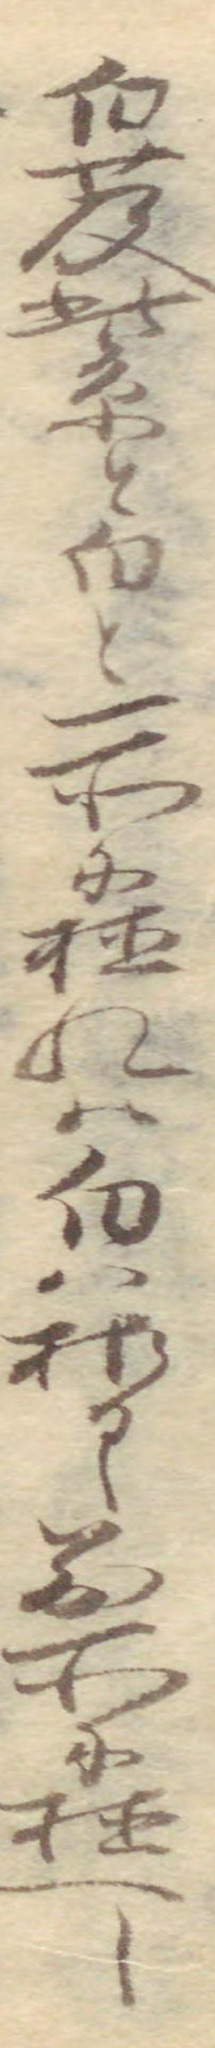一白芨紫と白と一所に植れハ白ハ枯るゝ別所に植へし
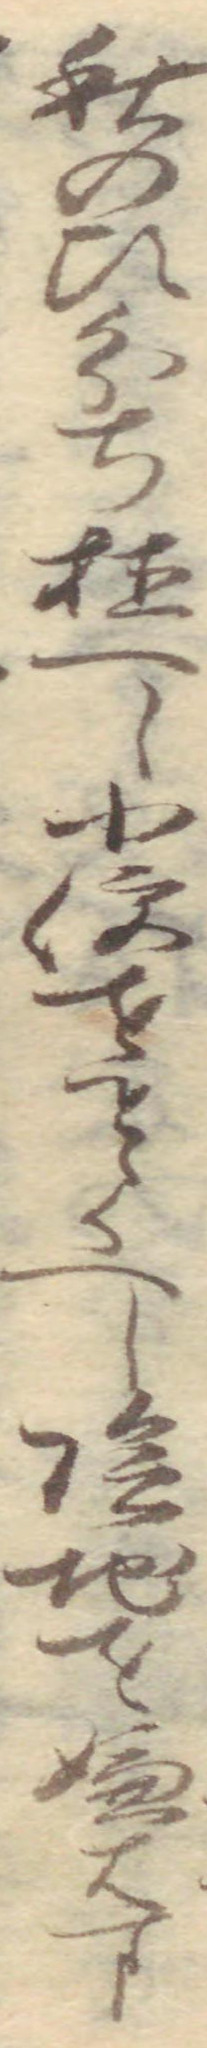秋の頃分ち植へし小便をそゝくへし陰地を嫌はす
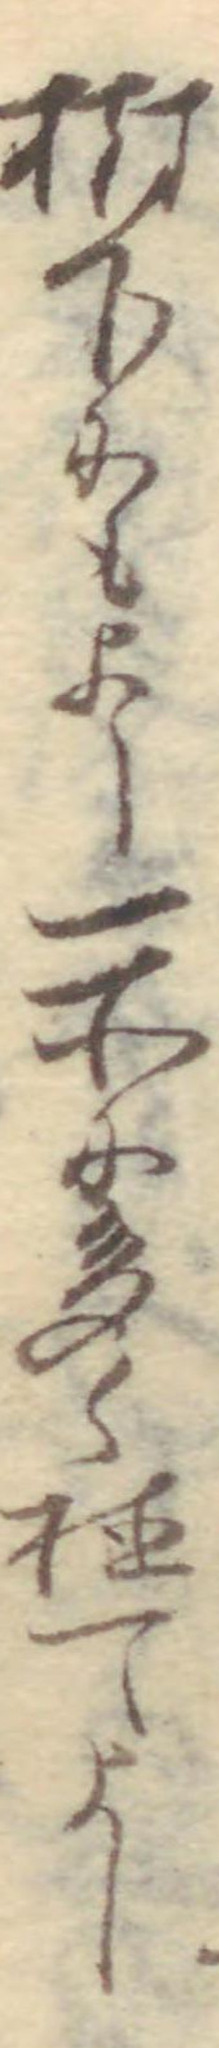樹下にもよし一所に多く植てよし
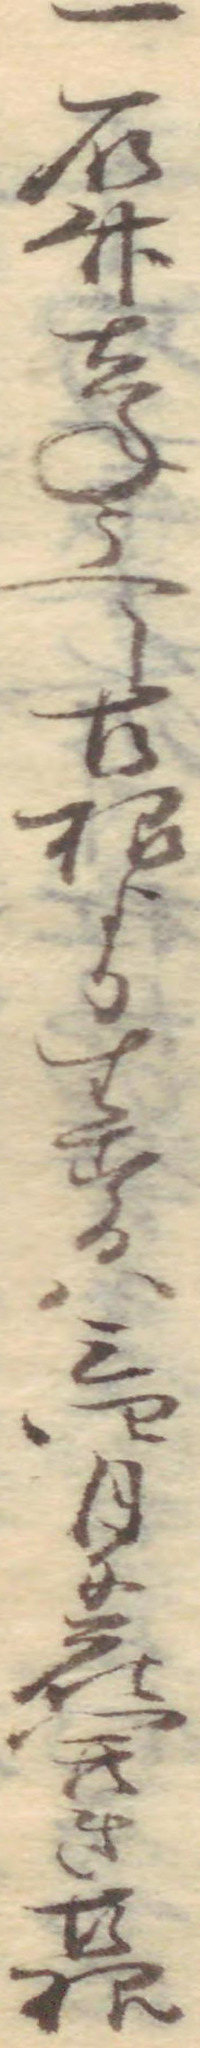一石竹去年うへし古根よりする生するハ三四月に花開き古根
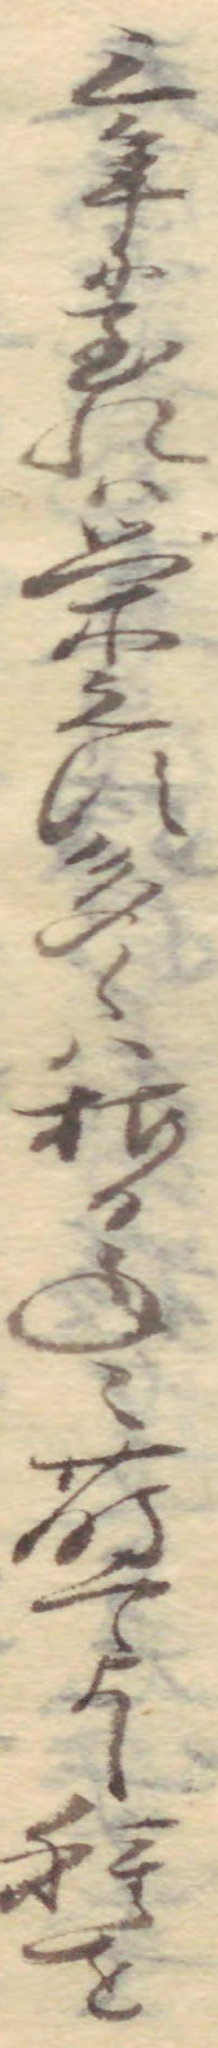三年に至れハ栄えす多くハ枯る年々蒔てよし種を
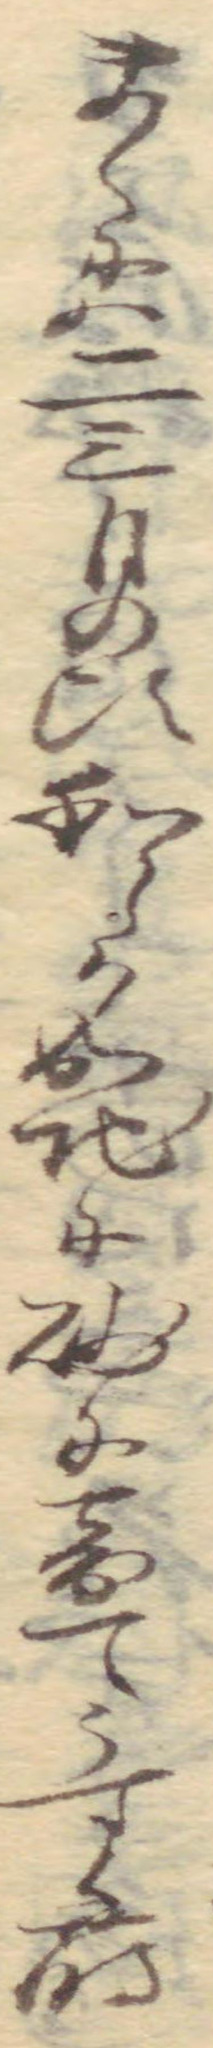まくにハ二三月の頃和らか成地に砂に寄てうすく蒔
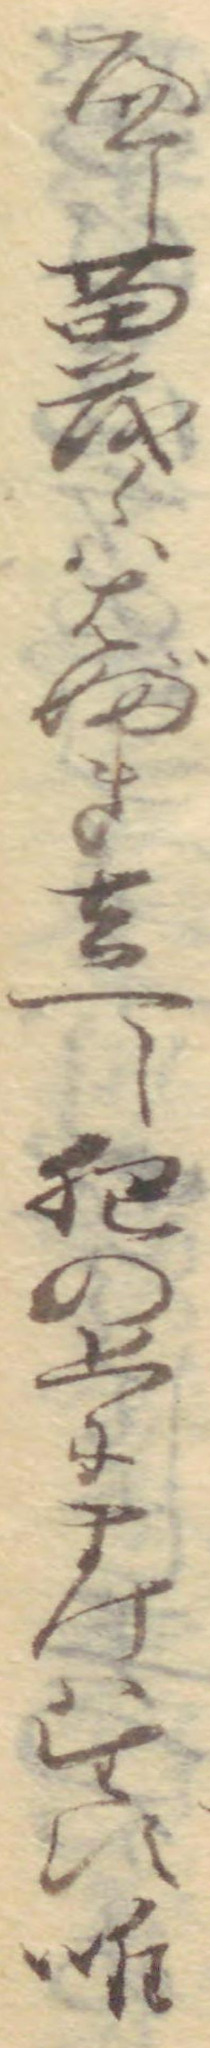へし苗茂くハはぶき去へし肥の上にまけハ生す唯
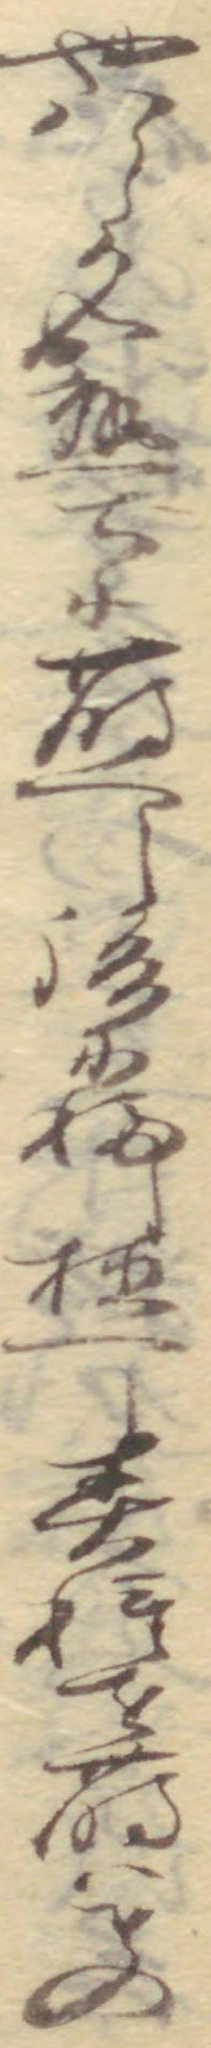やはらか成熟土に蒔へし後に移し植へし春種を蒔ハその
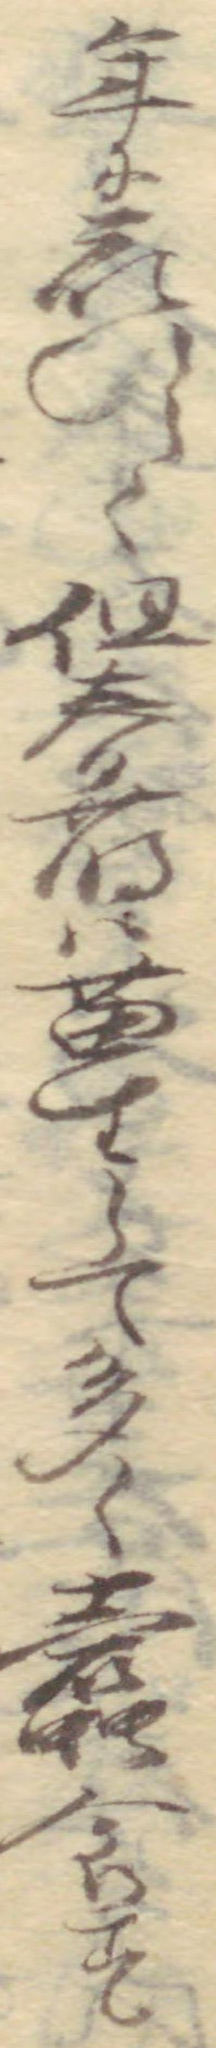年に花ひらく但し春蒔ハ苗生して多く蠹食す
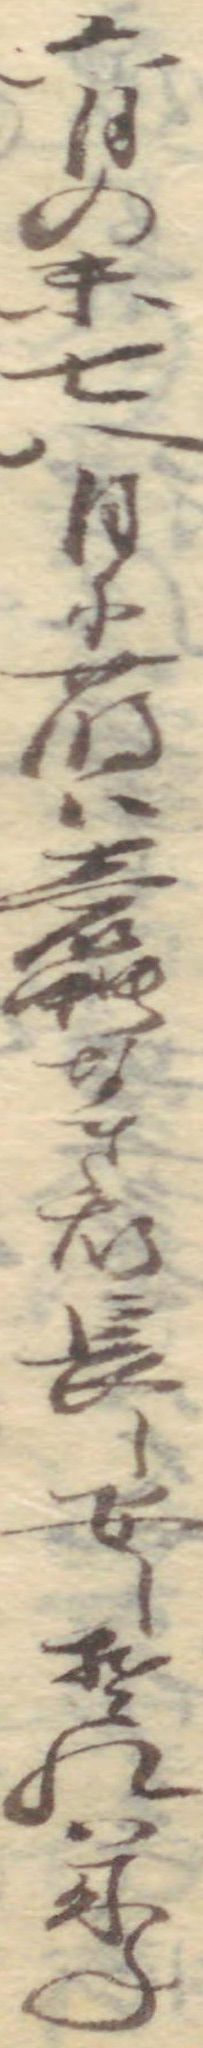六月の末七八月に蒔ハ蠹なき故長し安しそれは来年
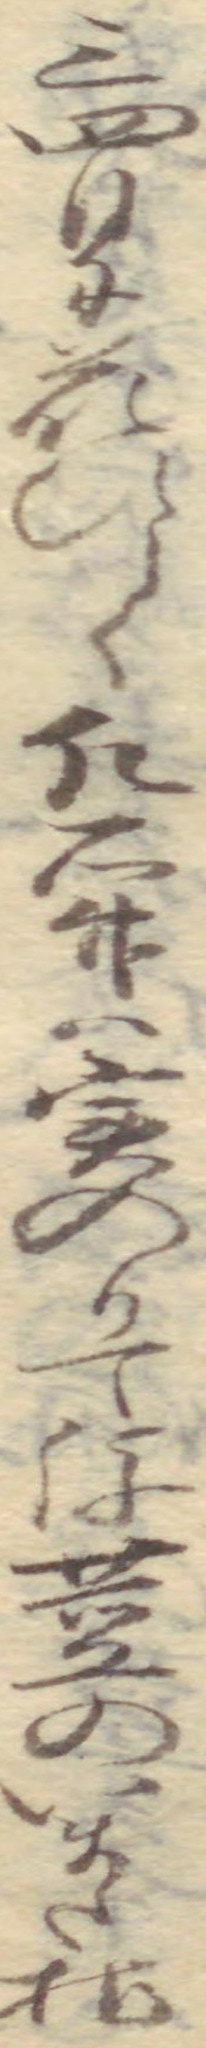三四月に花ひらく凡石竹ハ実のりて後茎のいまた枯
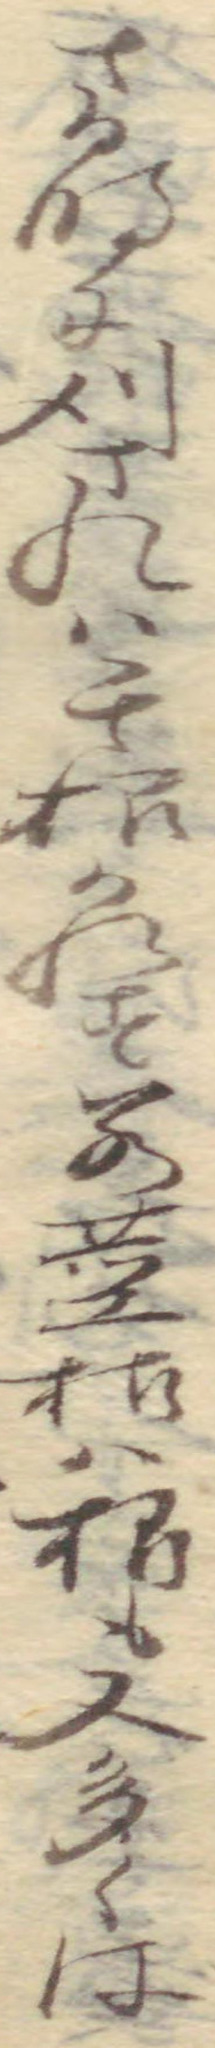さる時に刈されハ其根かれす若茎枯ハ根も又多くは
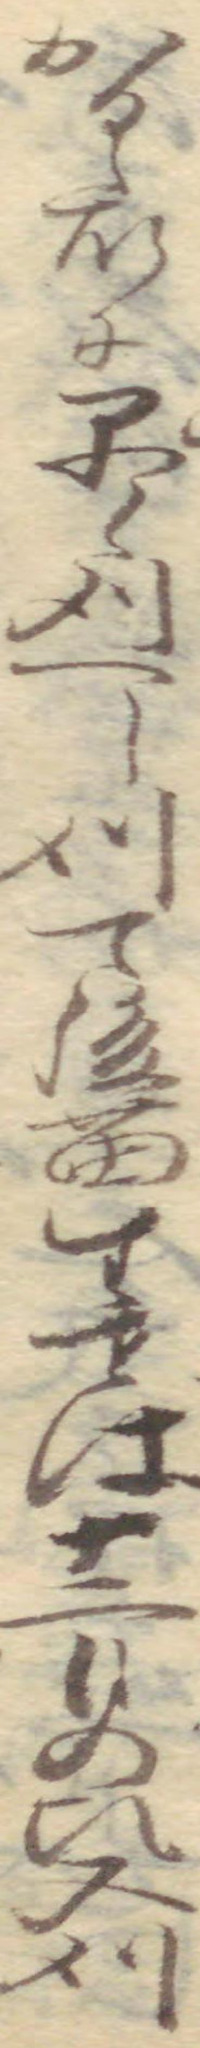かるゝ故に早く刈へし刈て後苗生せは十二月の頃又刈
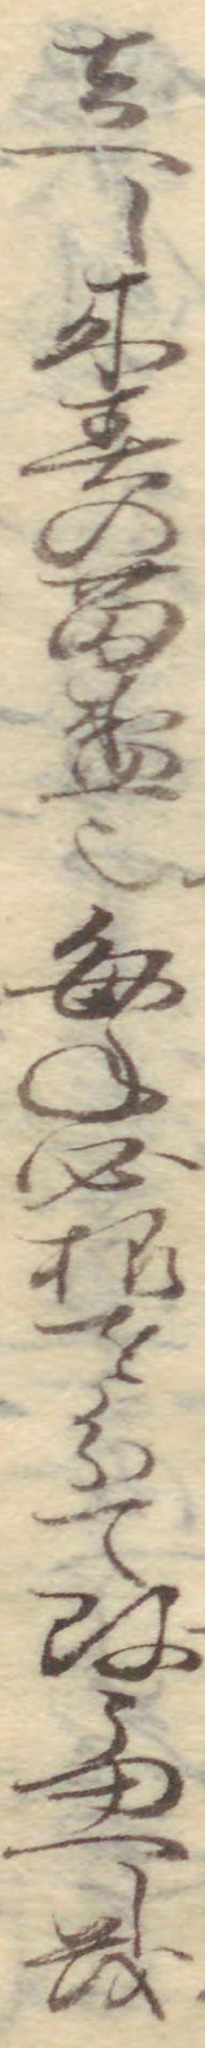去へし来春の苗盛也毎年必根を分て改うゆへし茂
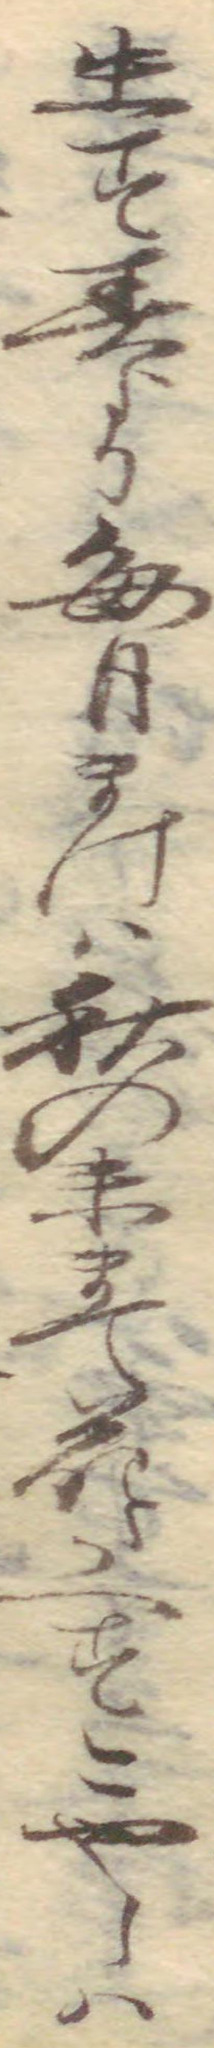生す春より毎月まけハ秋の末まて花たへすこやしハ
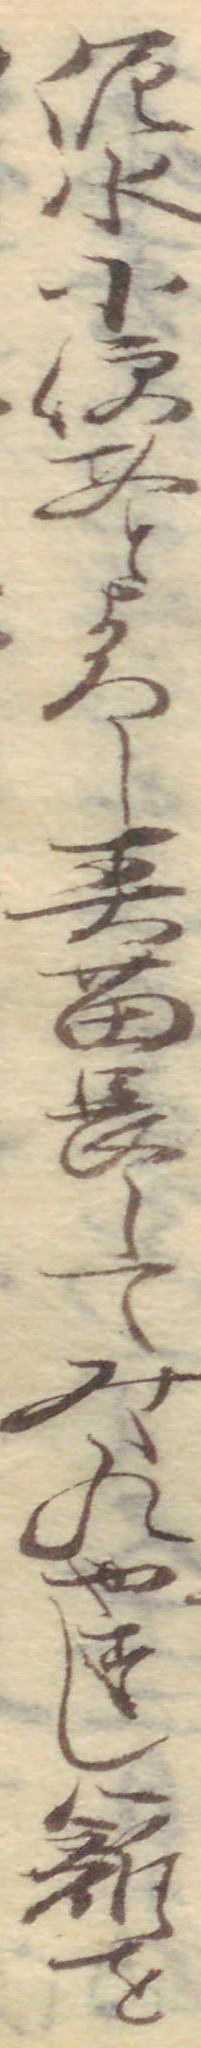泥水小便なとよろし春苗長してみたれやすし籬を
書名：鶯宿雑記. 巻199-200
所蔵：国立国会図書館 National Diet Library, JAPAN
